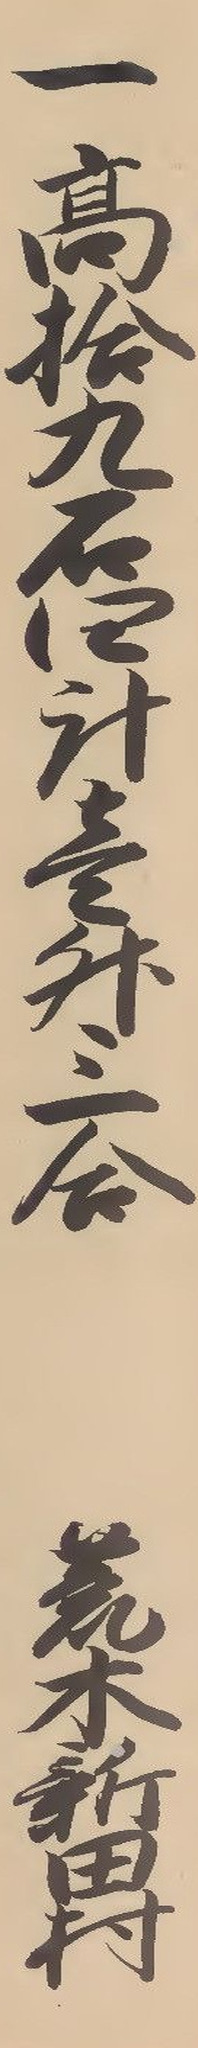一高拾九石四斗壱升三合荒木新田村
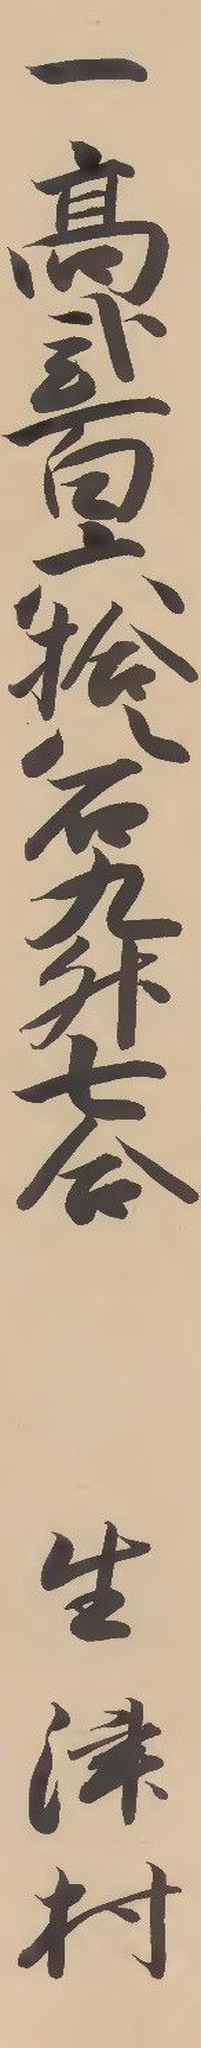一高弍百六拾八石九升七合生津村
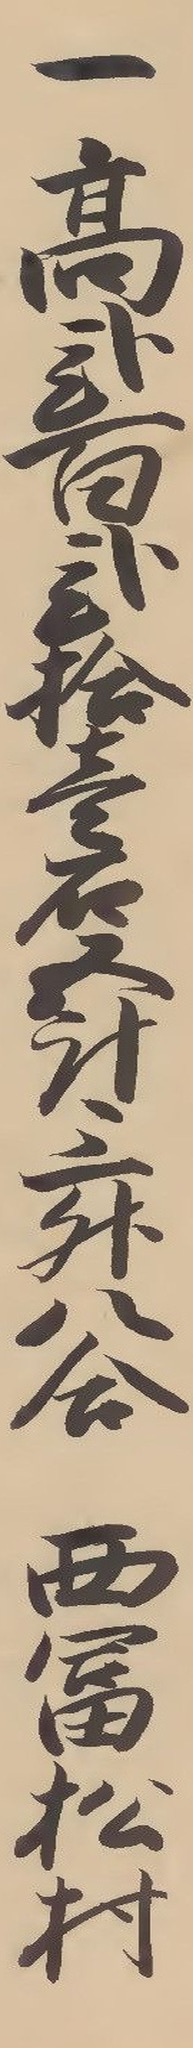一高弍百弐拾壱石五斗三升八合西富松村
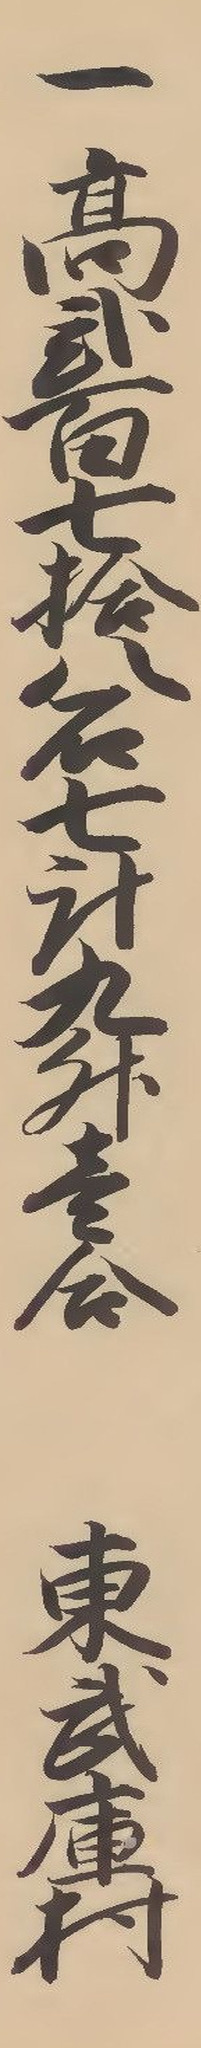一高弍百七拾八石七斗九升壱合東武庫村

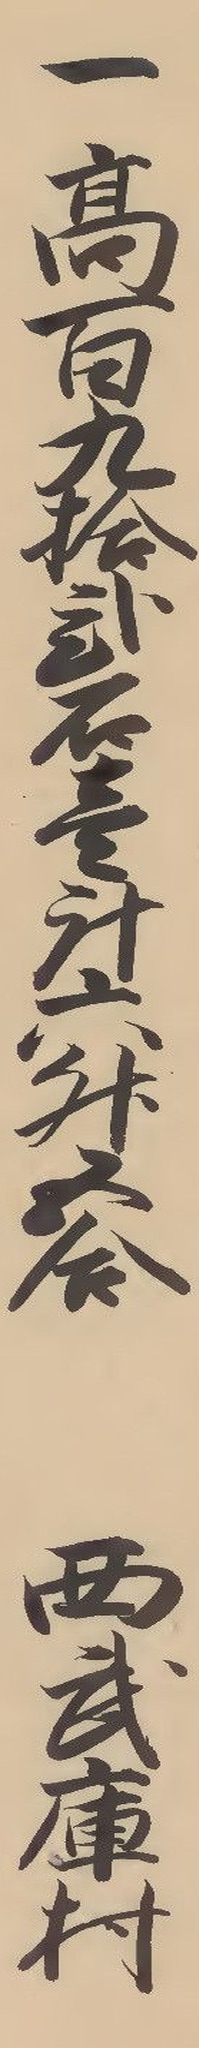一高百九拾弐石壱斗六升五合西武庫村
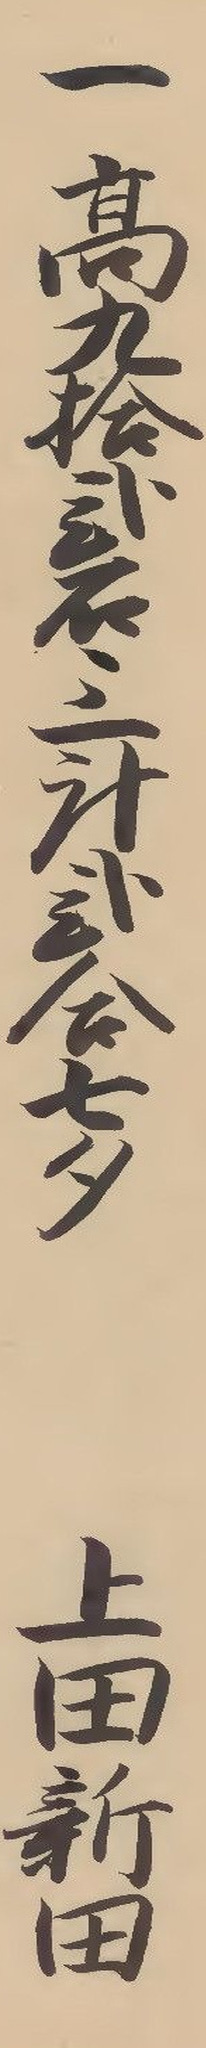一高九拾弐石三斗弐合七勺上田新田
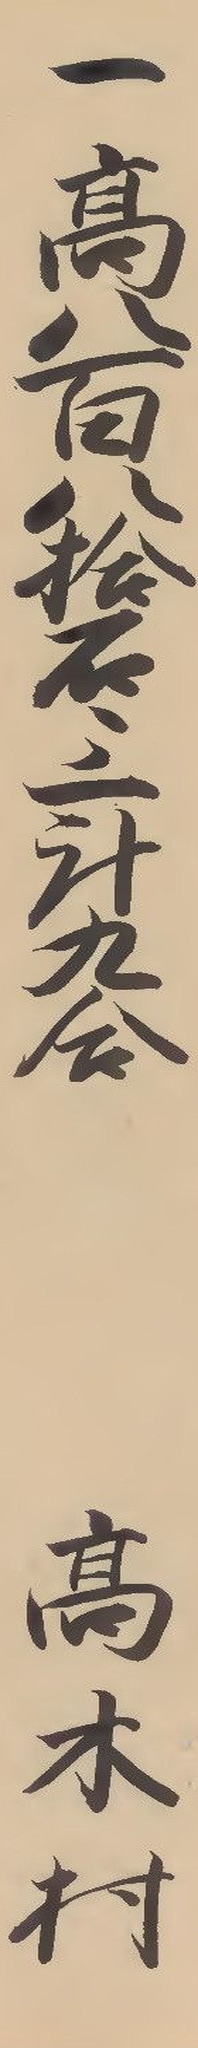一高八百八拾石三斗九合高木村
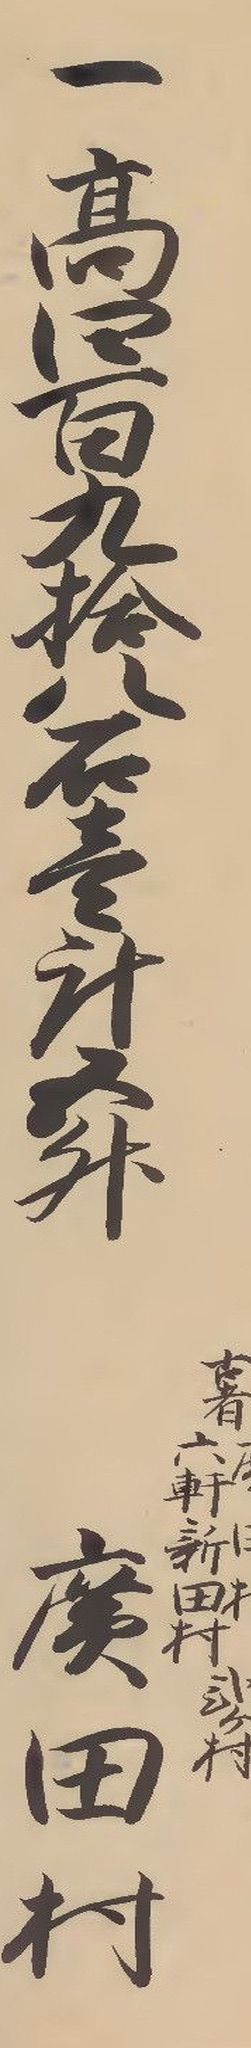一高四百九拾八石壱斗五升広田村
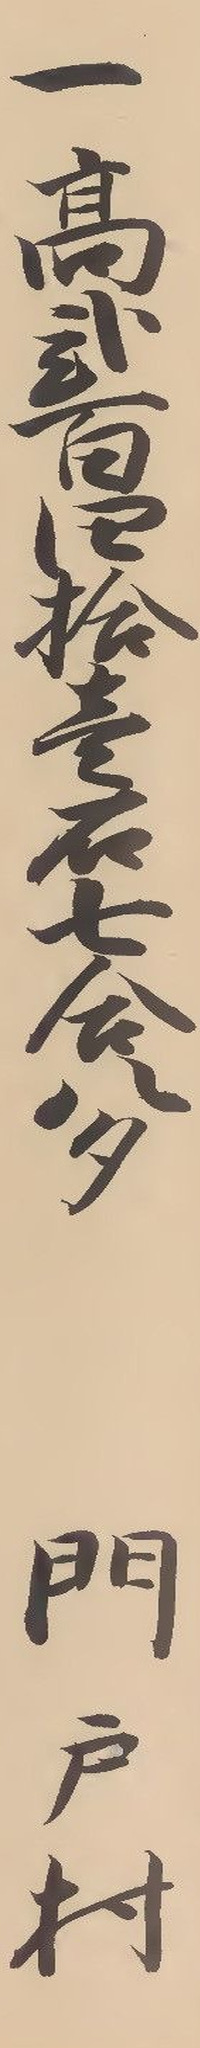一高弍百四拾壱石七合八勺門戸村
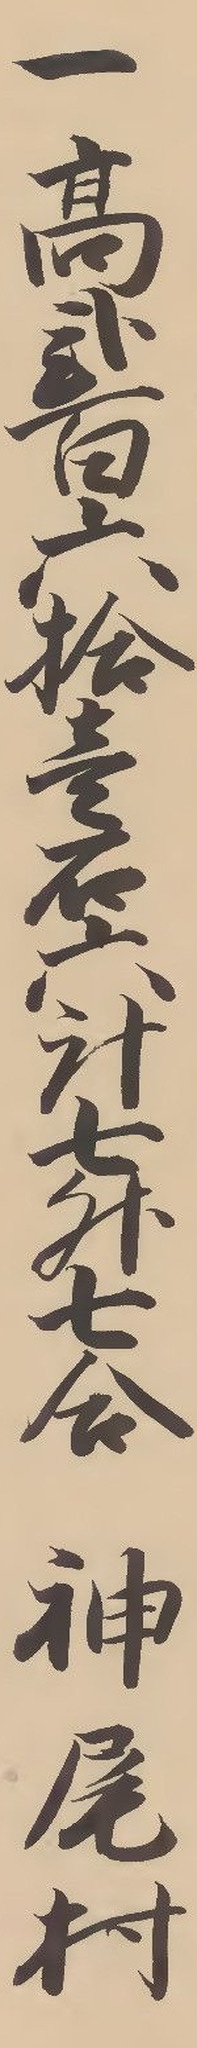一高弍百六拾壱石六斗七升七合神尾村
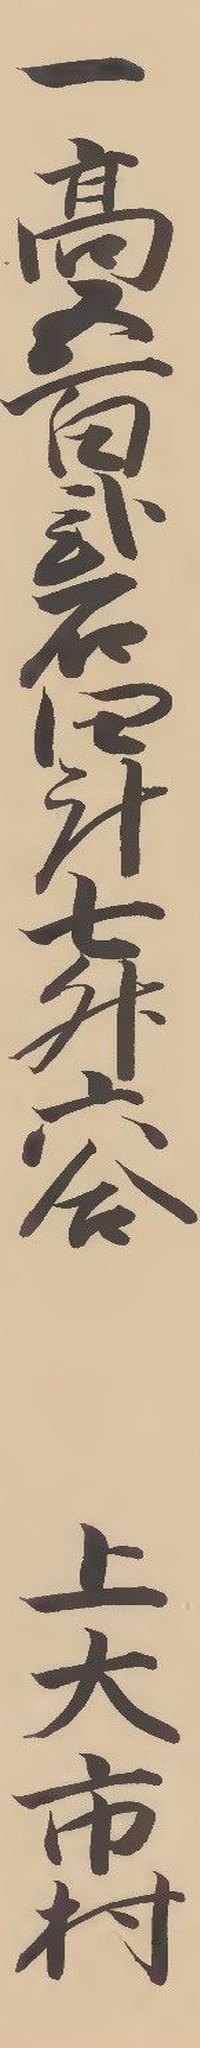一高五百弐石四斗七升六合上大市村
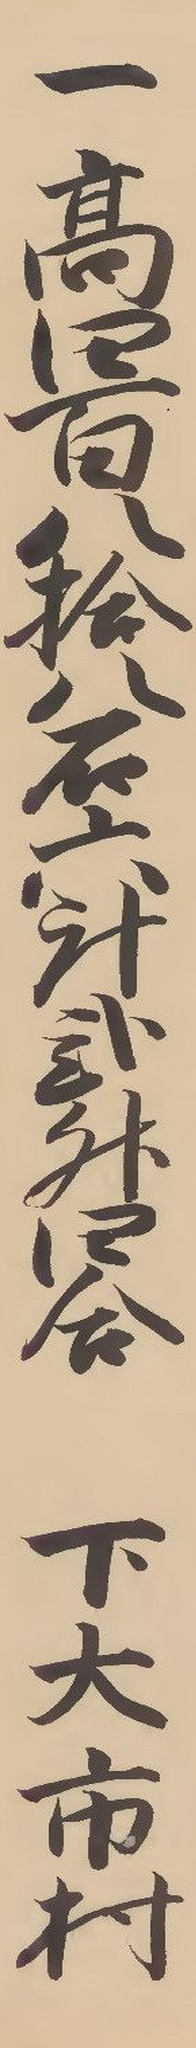一高四百八拾八石六斗弐升四合下大市村

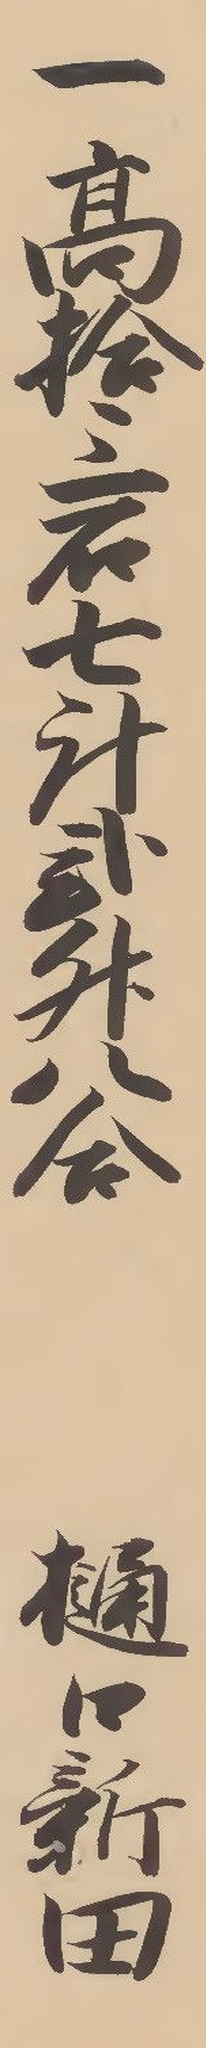一高拾三石七斗弐升八合樋口新田
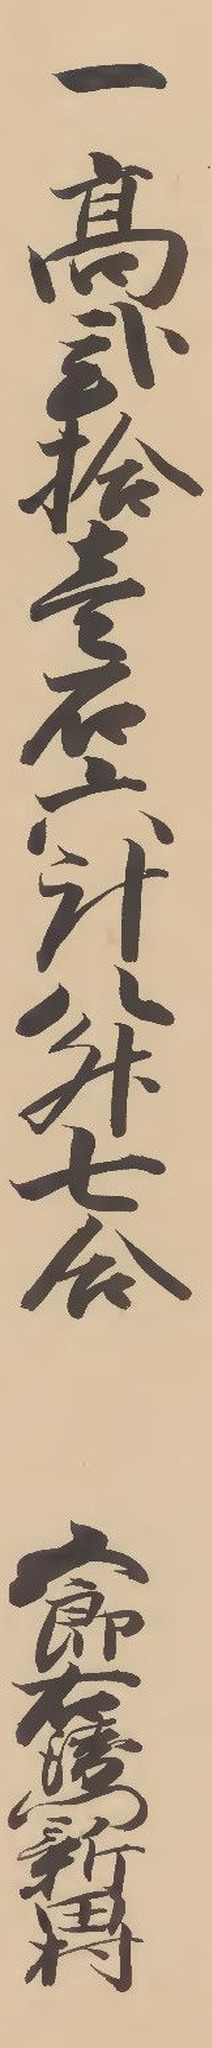一高弐拾壱石六斗八升七合五郎右衛門新田村
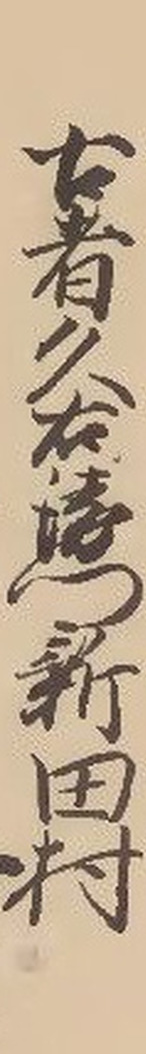古者久右衞門新田村
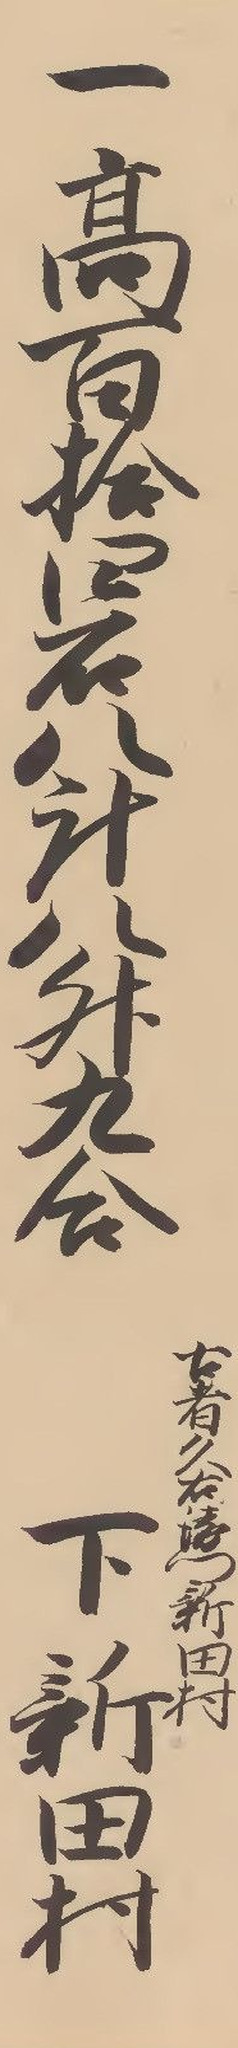一高百拾四石八斗八升九合下新田村
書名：摂津国郷帳
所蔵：国立公文書館 National Archives of Japan
